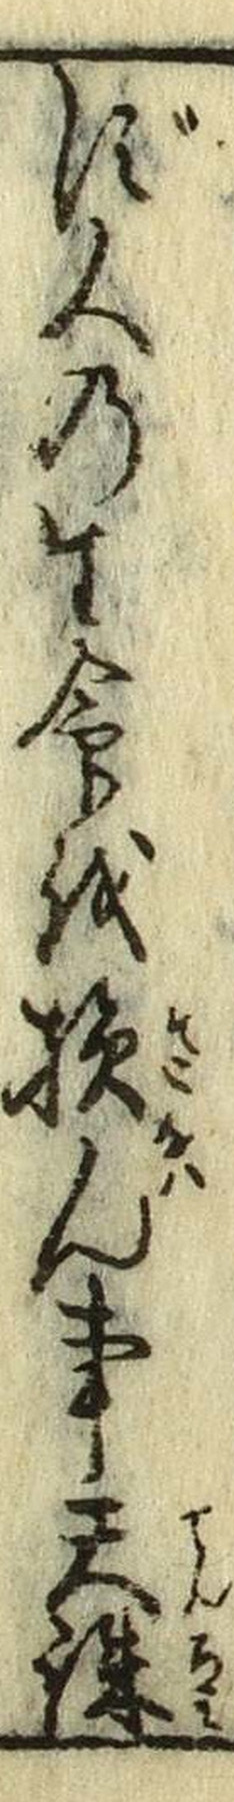ず人の生命を損ん事天誅
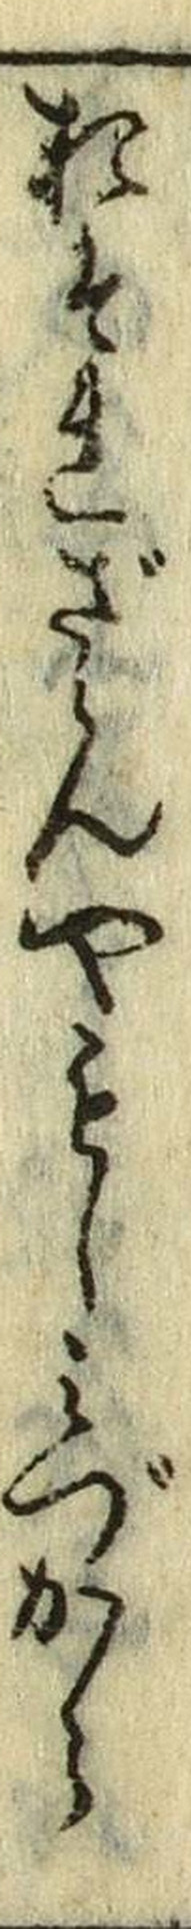おそれざらんやもしみづから

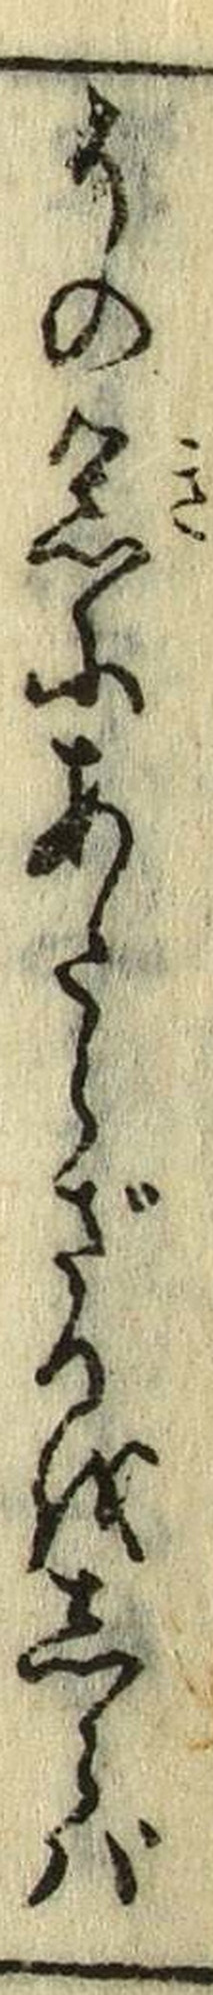その忌にあたらざるをしらば
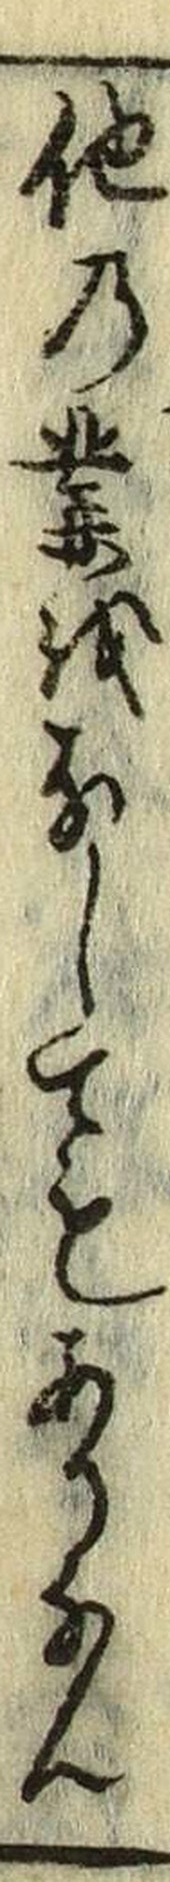他の業をなしてもありなん
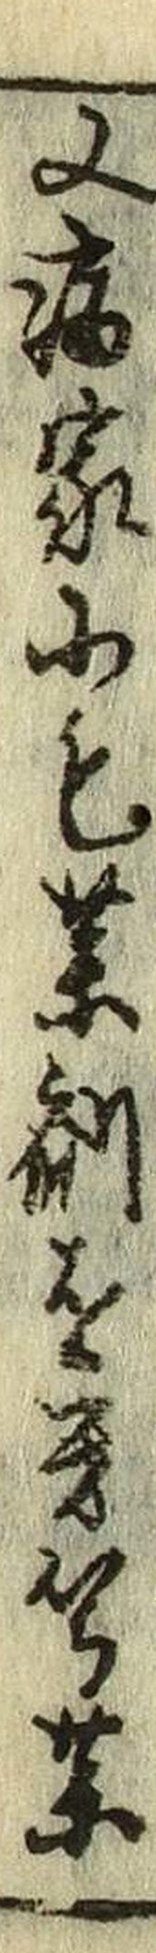又病家にも薬剤を幾等薬
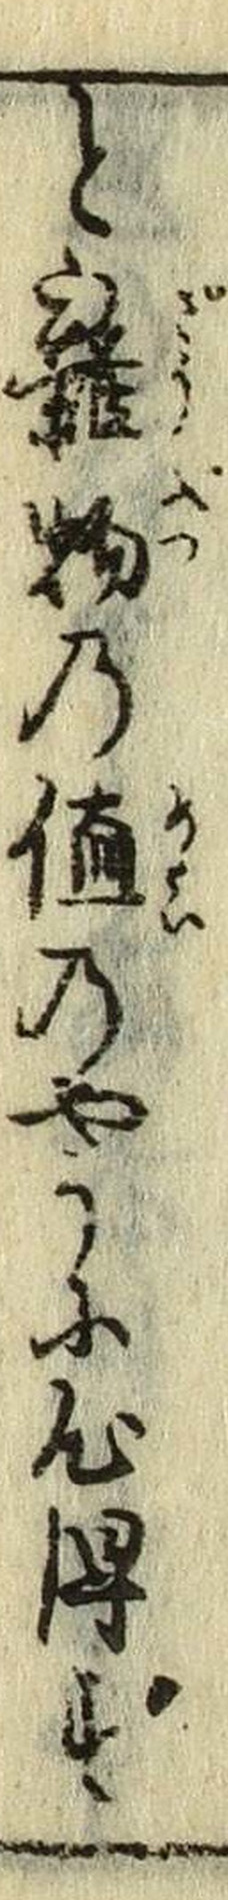と雑物の値のやうに心得ず
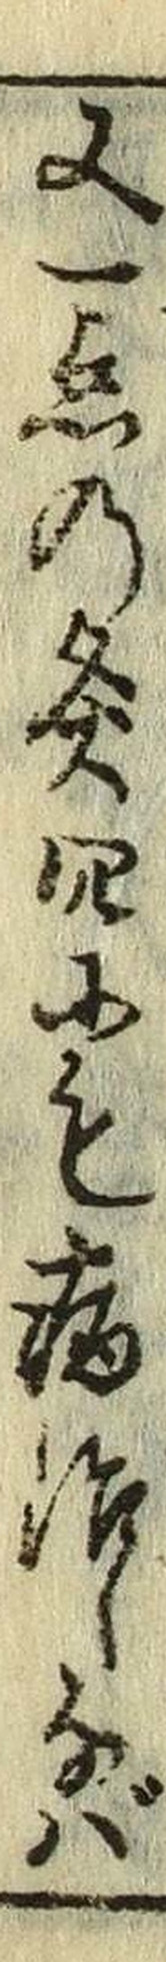又一点の灸穴にも病治しなば
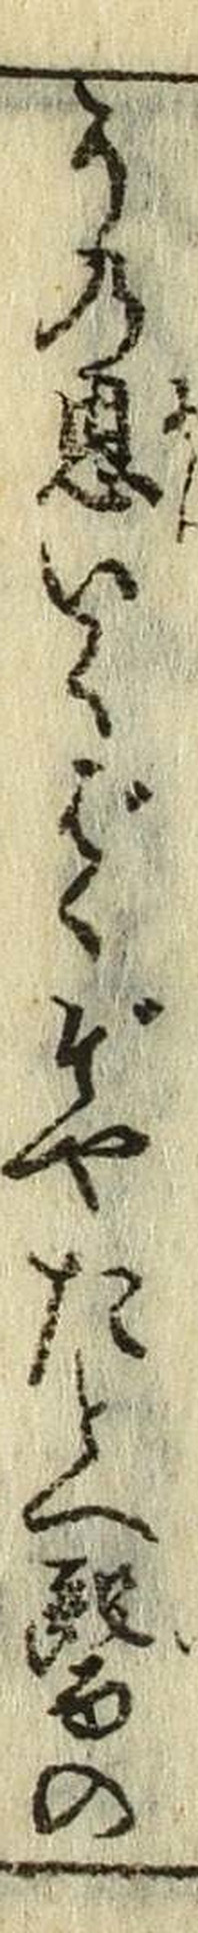その恩いくばくぞやたとへ医の
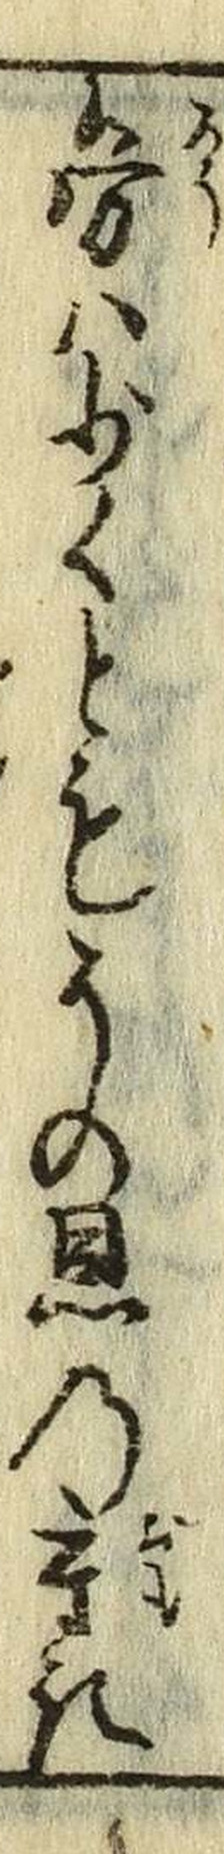労は少くともその恩の重き
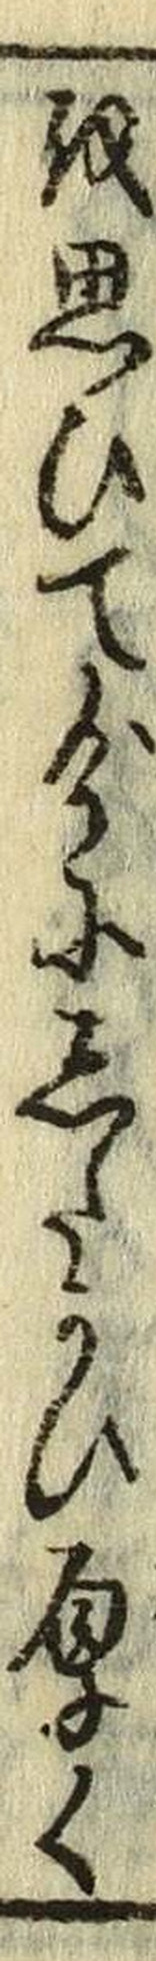を思ひて分にしたかひ厚く
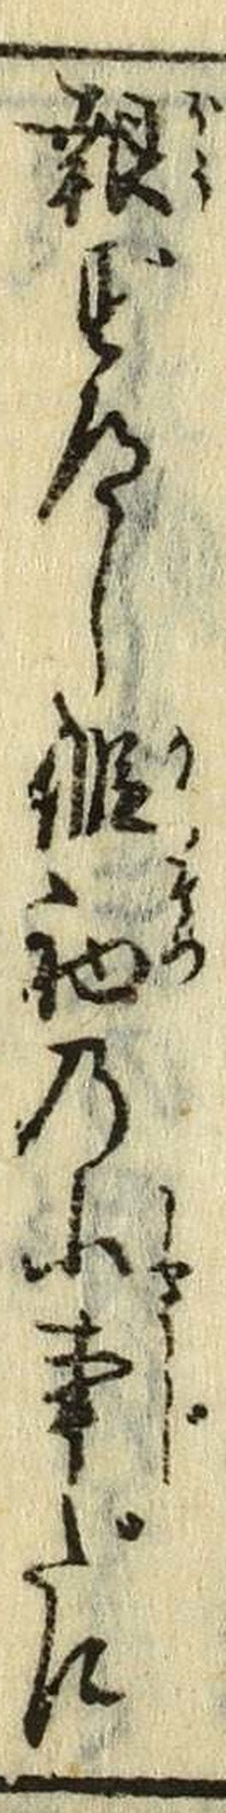報ずへし仮初の小事だに
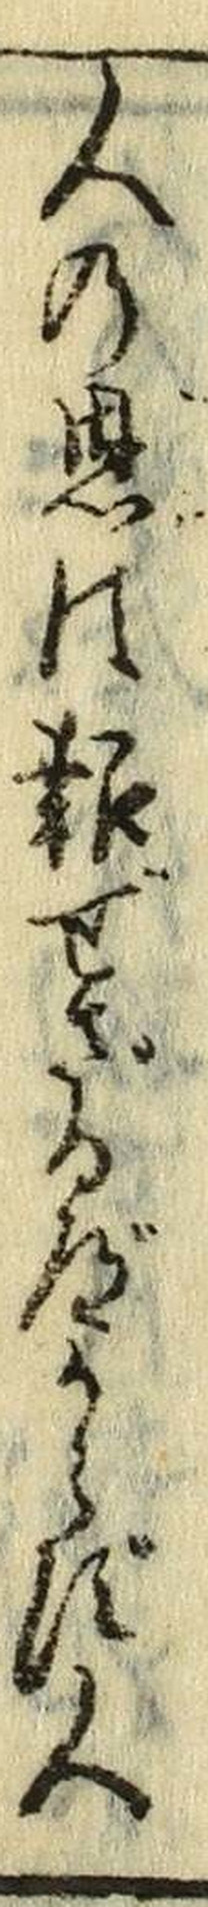人の恩は報ぜざるべからず人
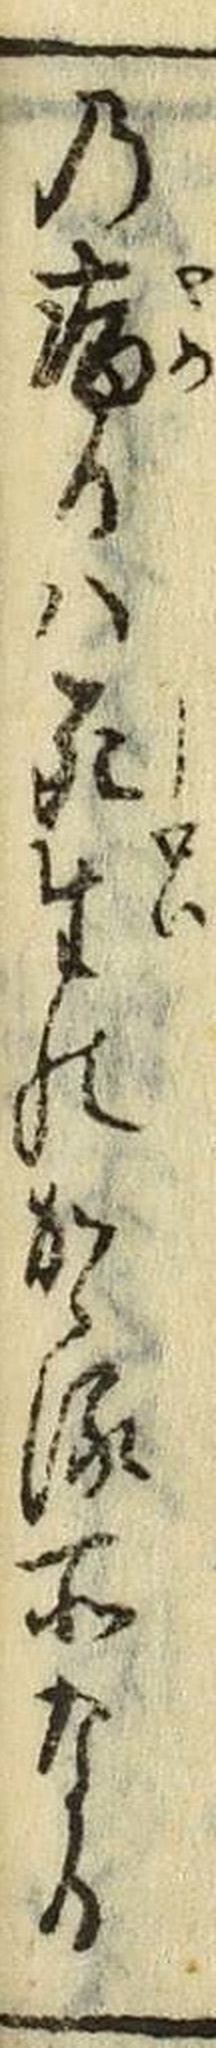の病るは死生のかゝる所なる
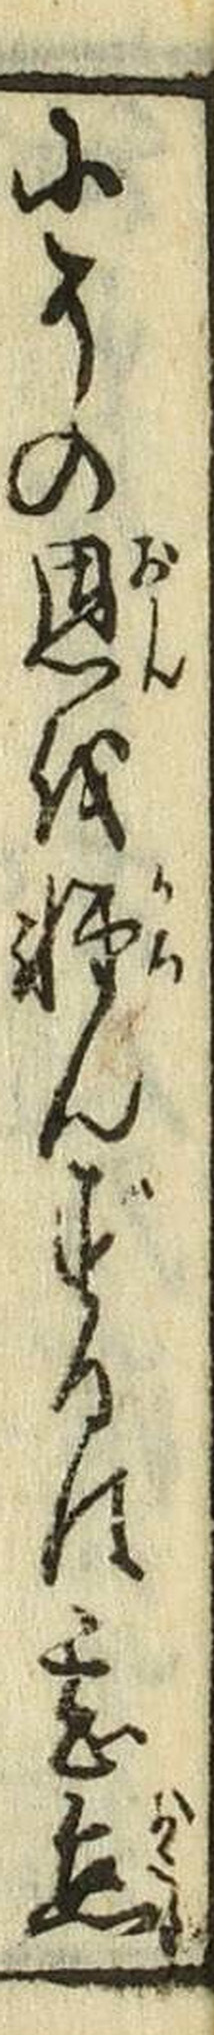にその恩を軽んずるは甚怠
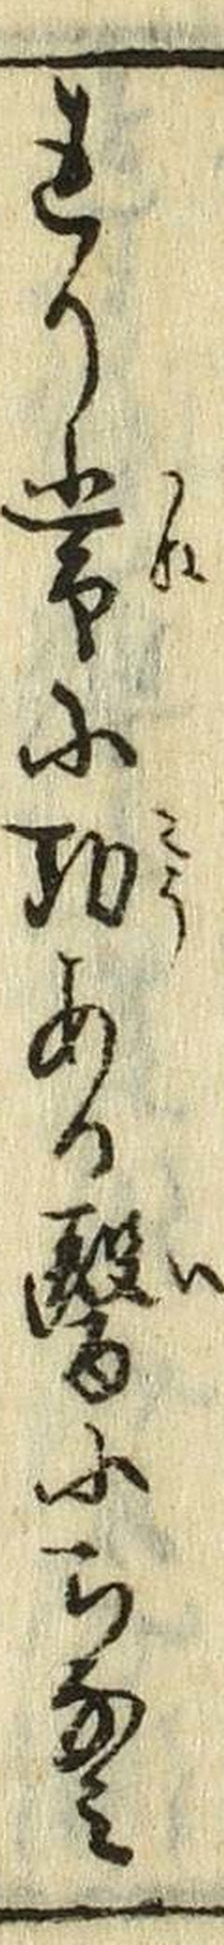れり常に功ある医にちなみ
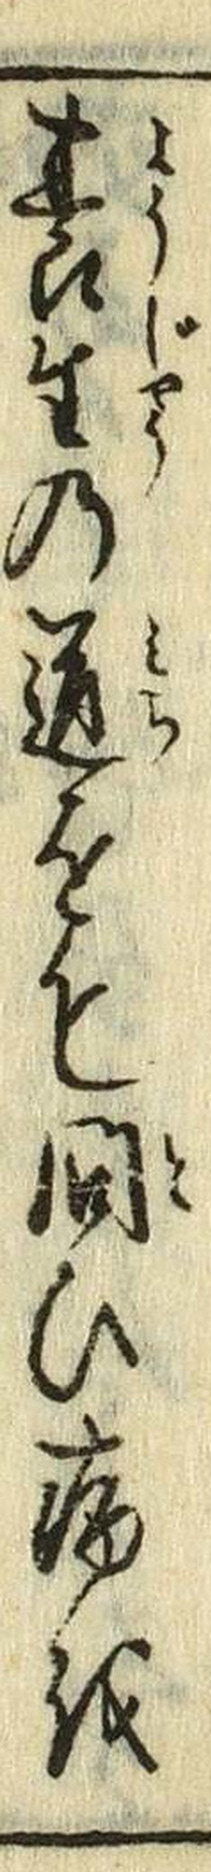養生の道をも問ひ病を
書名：居家養生記
